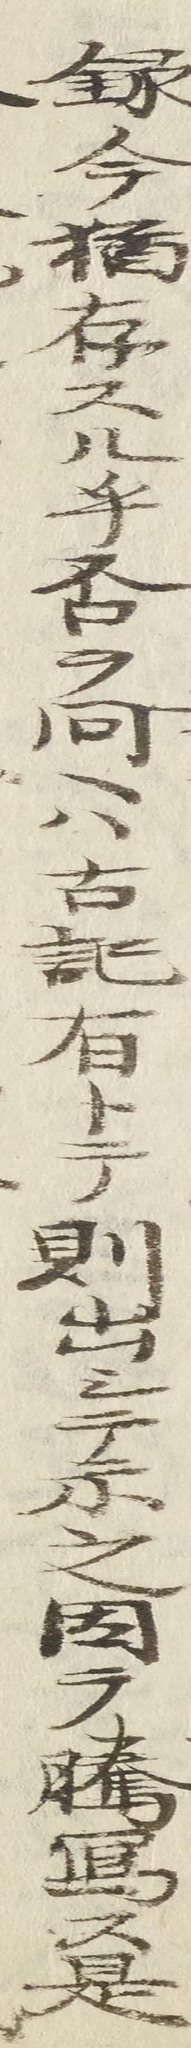録今猶存する乎否を問へは古記有とて則出して示之因て謄写す是
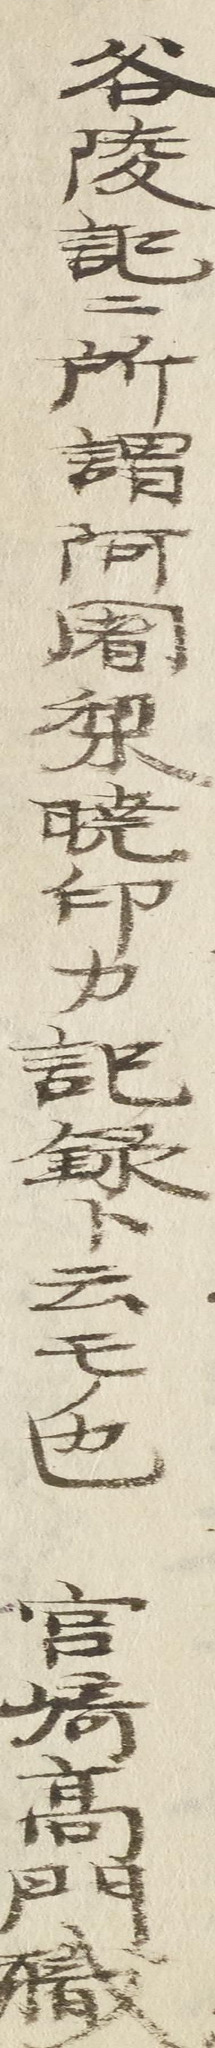谷陵記に所謂阿闍梨暁印か記録と云ものかし宮崎高門職
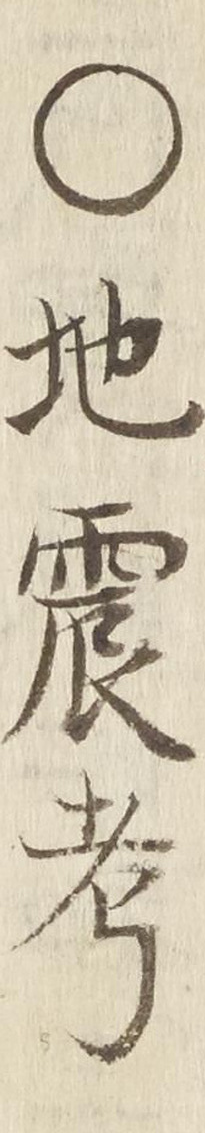◯地震考
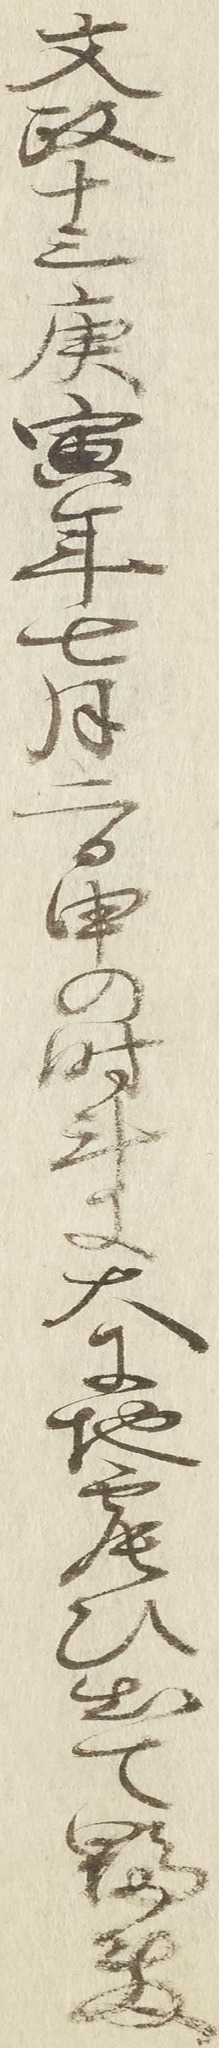文政十三庚寅年七月二日申の時斗に大に地震ひ出て夥敷
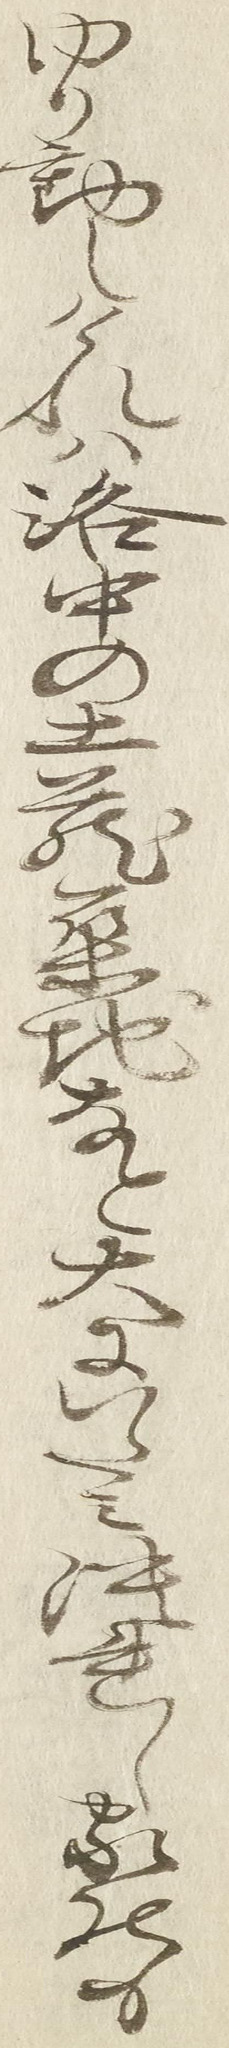ゆり動しけれは洛中の土蔵築地なと大にいたみ潰れし家居も
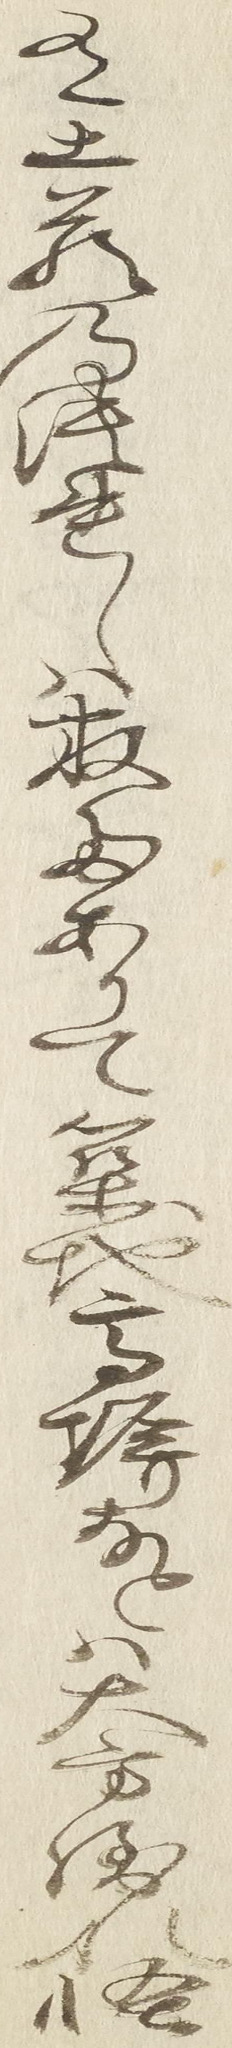有土蔵の潰れしは数多ありて築地高塀なとは大方倒れ怪
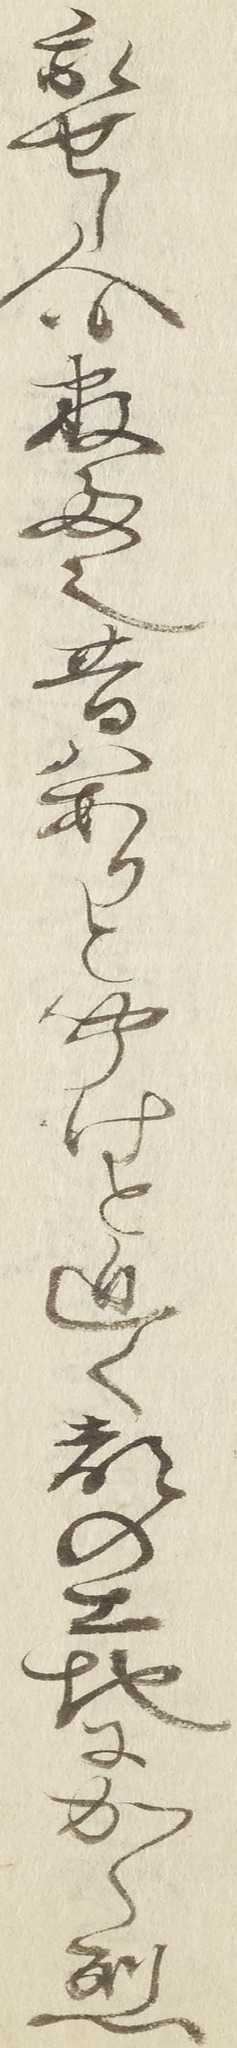我せし人も数多也昔はありと聞けと近く都の土地にかく烈
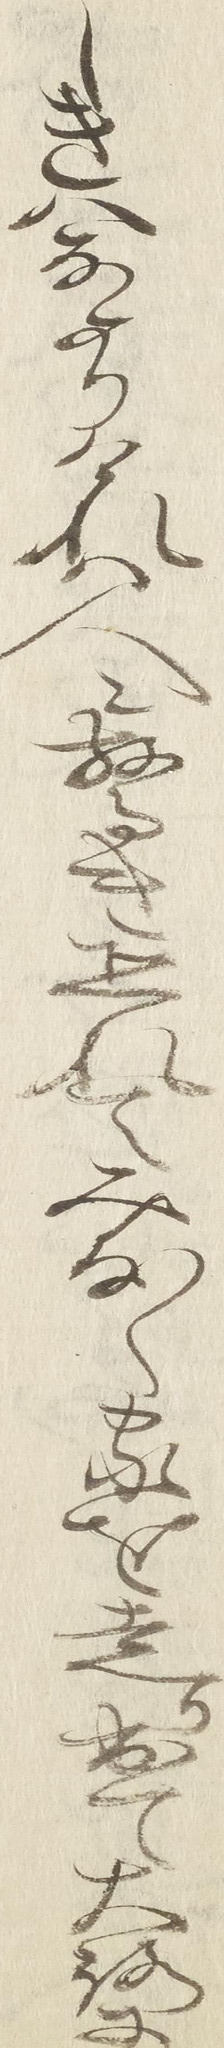しきはなかりけれは人々驚き恐れてみな〳〵家を走り出て大路に
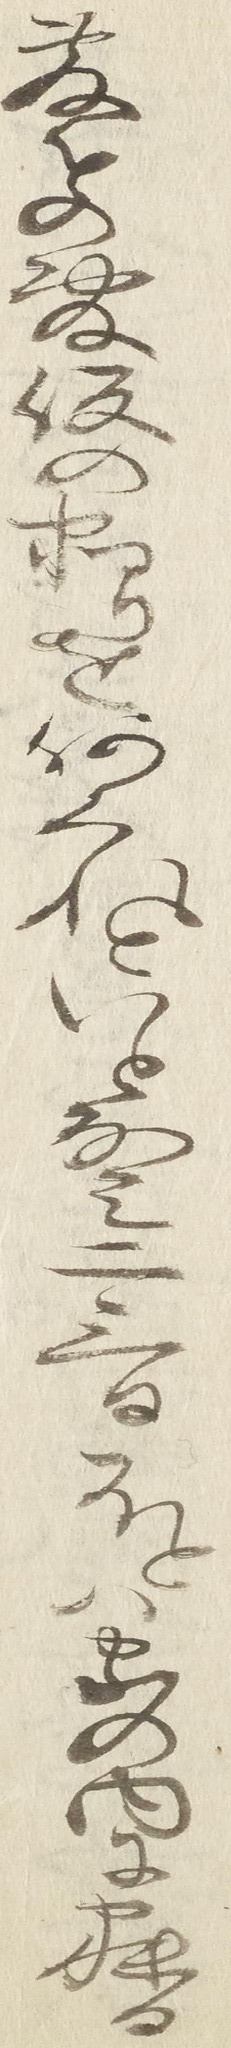敷もの敷仮の宿りを何くれといとなみ二三日ほとは家の内に寝る
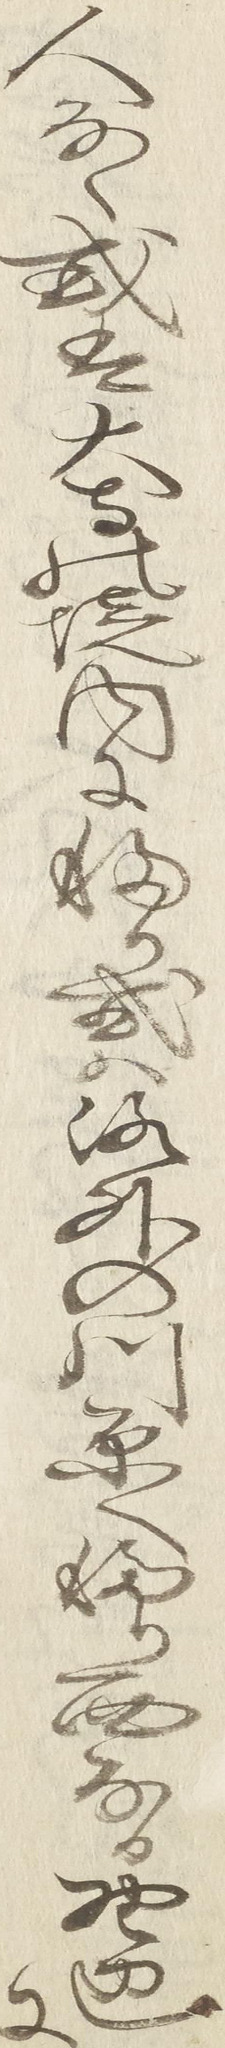人なく或は大寺の境内移り或は洛外の川原へ移り西なる野辺に
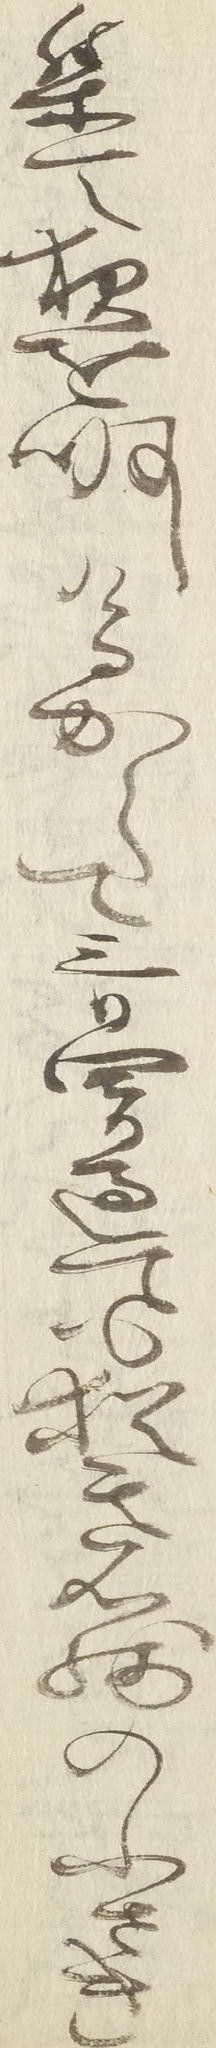集て夜を明けるかくて三日四日過ても猶も名残の小さき
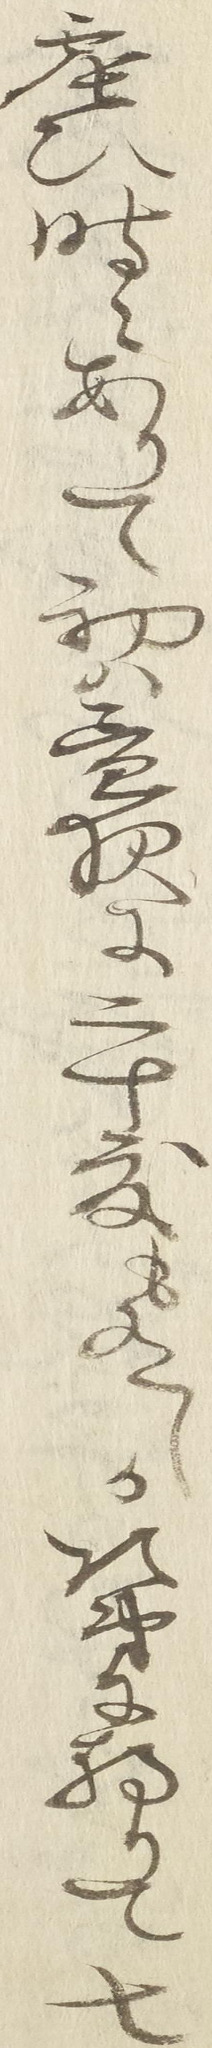震ひ時々ありて初は昼夜に二十度も有しか次第に静りて七

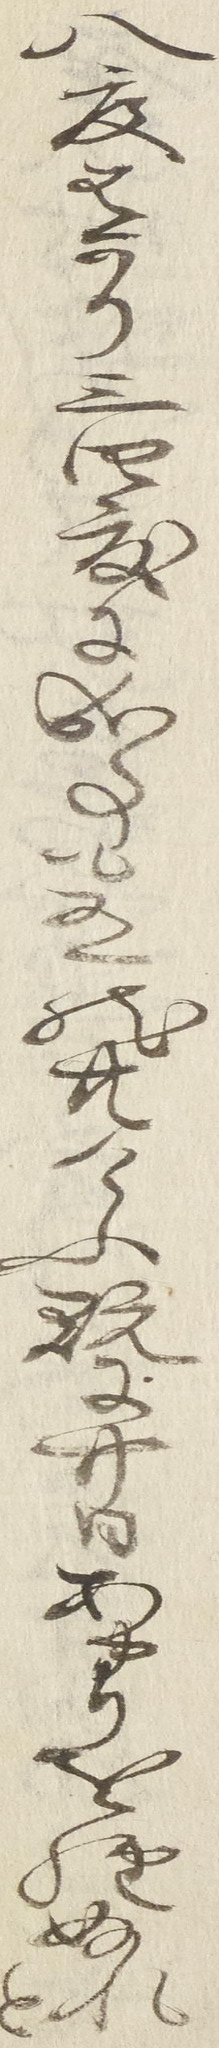八度はかり三四度に成る事も有然共けふ既に廿日あまりを経ぬれと
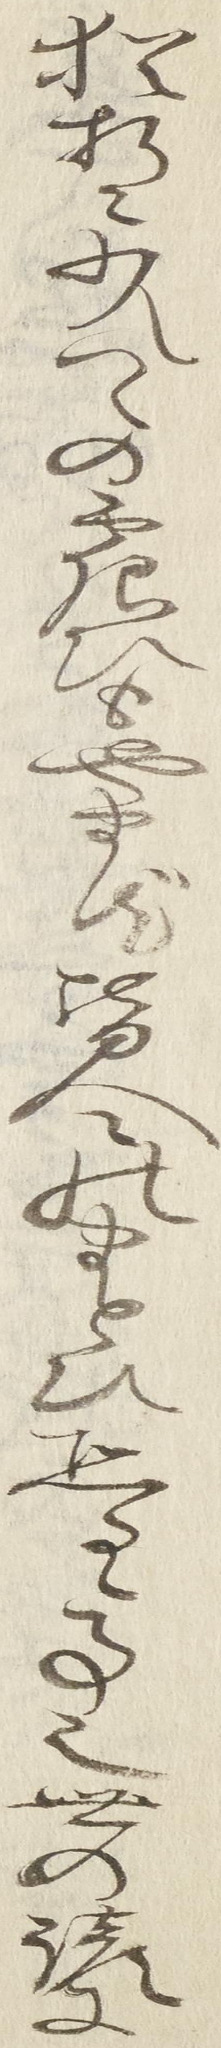猶折々少しつゝの震ひもやまず皆人々のまとひ恐るゝ事也世の諺に
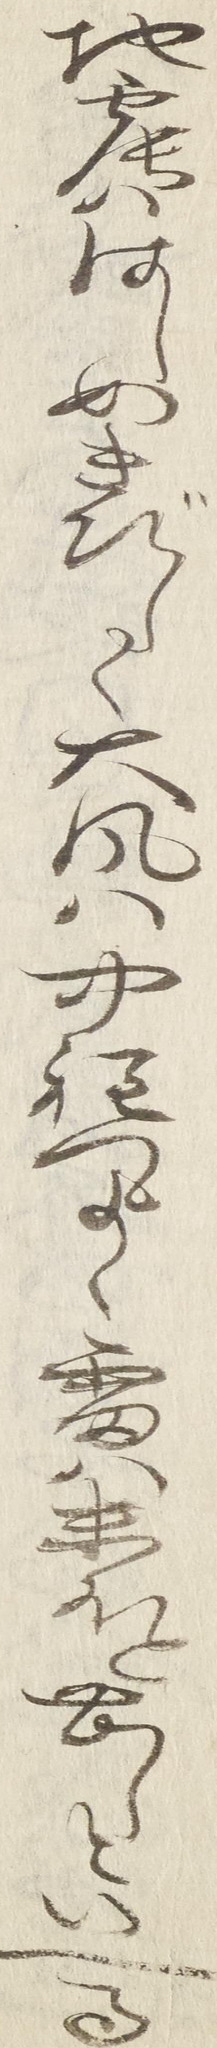地震ははしめきびしく大風は中程つよく雷は末ほと甚しといへる
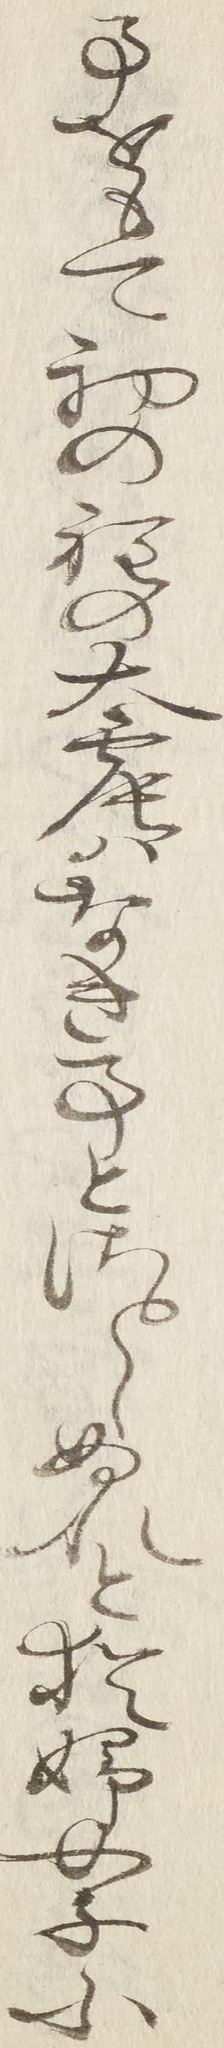事をもて初の程の大震はなき事とおもぬれと猶婦女子小
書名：地震記　下
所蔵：東京大学地震研究所図書室 Earthquake Research Institute Library, The University of Tokyo, JAPAN
